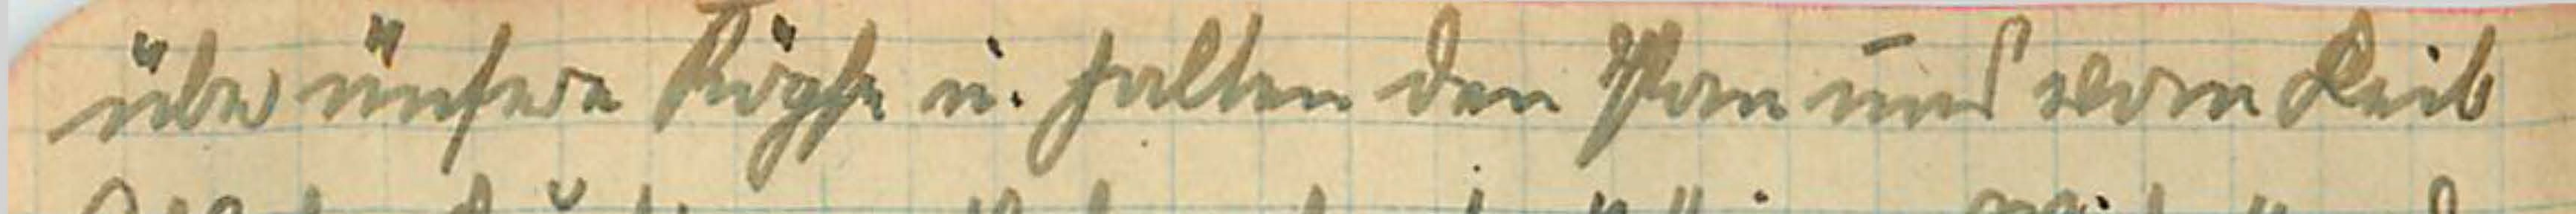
über unsere Köpfe u. halten den Pan uns vom Leib.
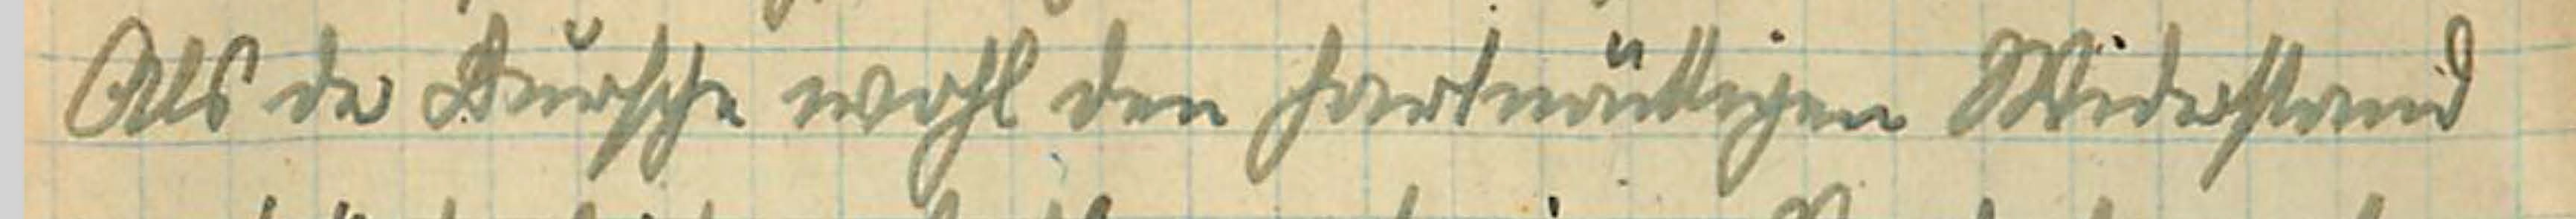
Als der Bursche wohl den hartnäckigen Widerstand
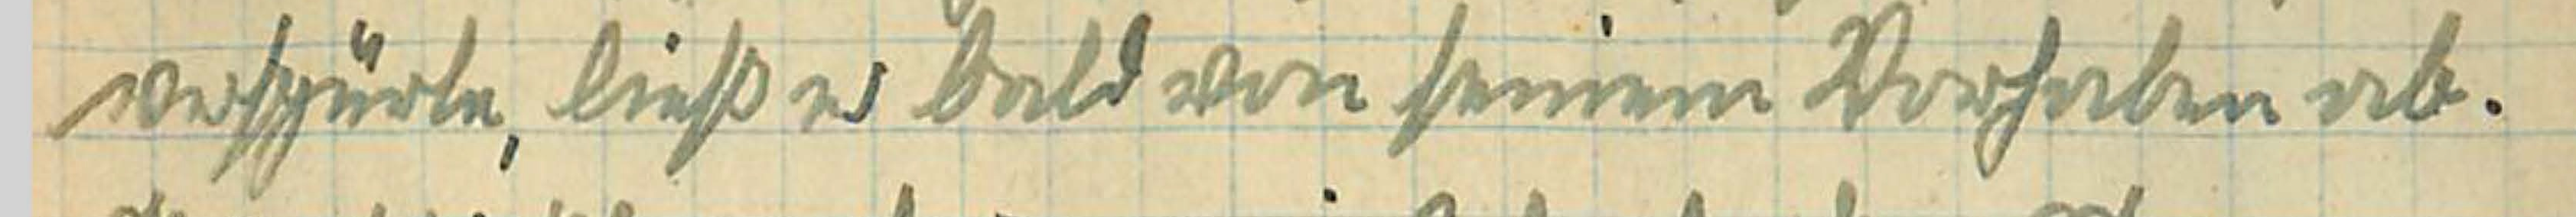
verspürte, ließ er bald von seinem Vorhaben ab.
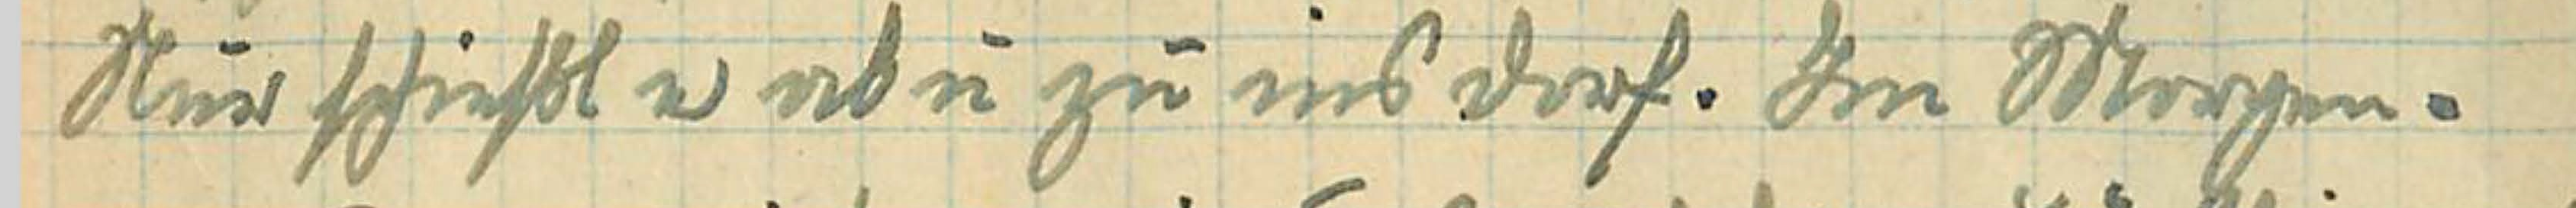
Nun schießt er ab und zu ins Dorf. Im Morgen-
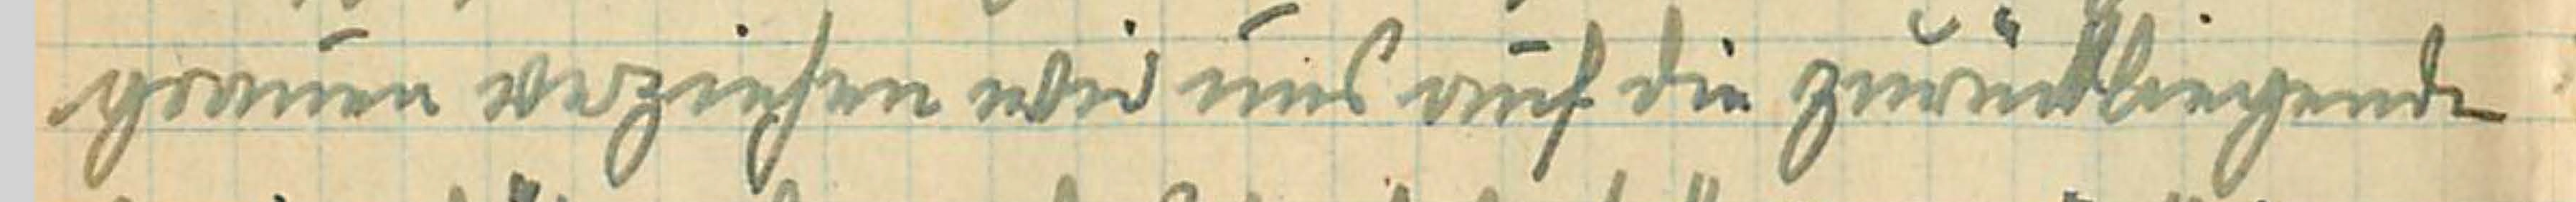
grauen verziehen wir uns auf die zurückliegenden
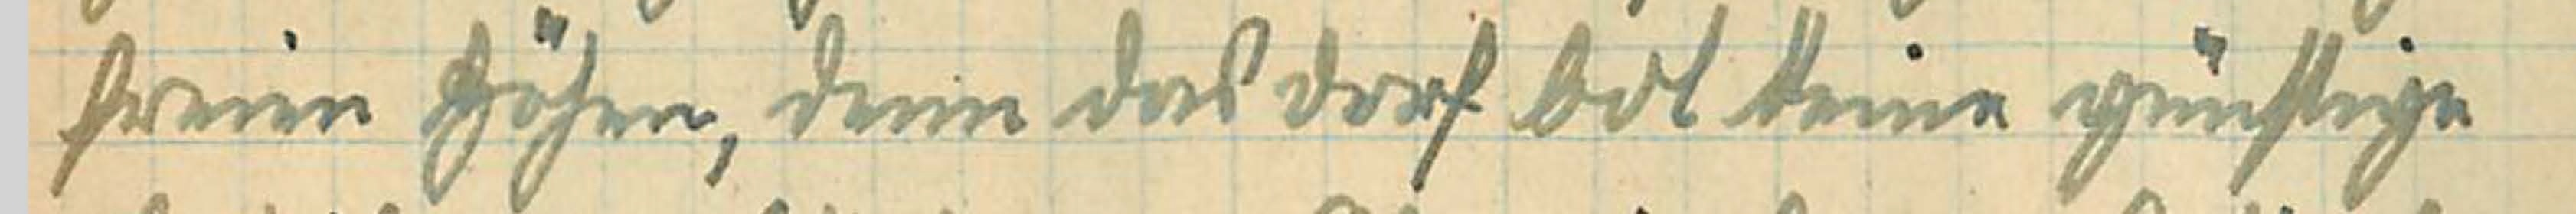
freien Höhen, denn das Dorf bot keine günstige
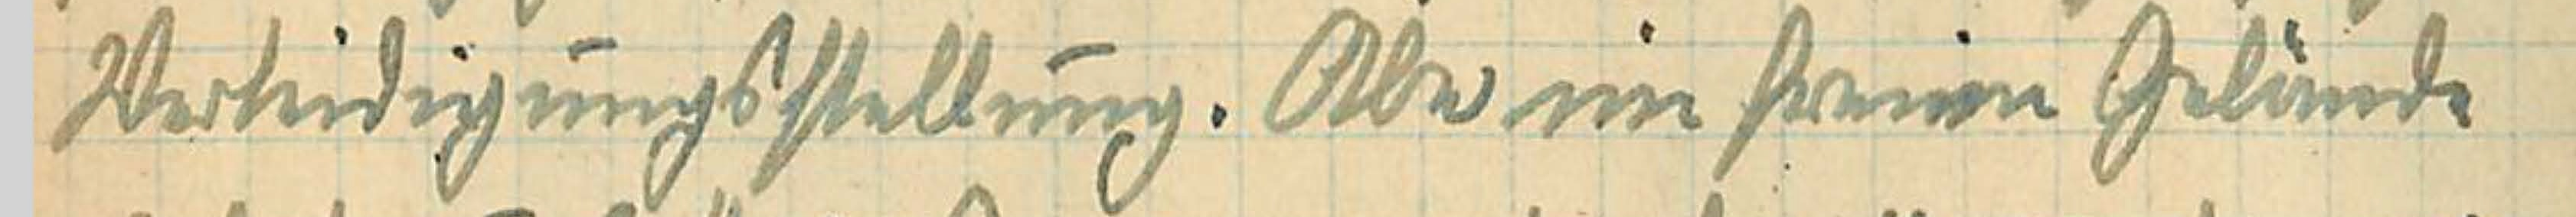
Verteidigungsstellung. Aber im freien Gelände
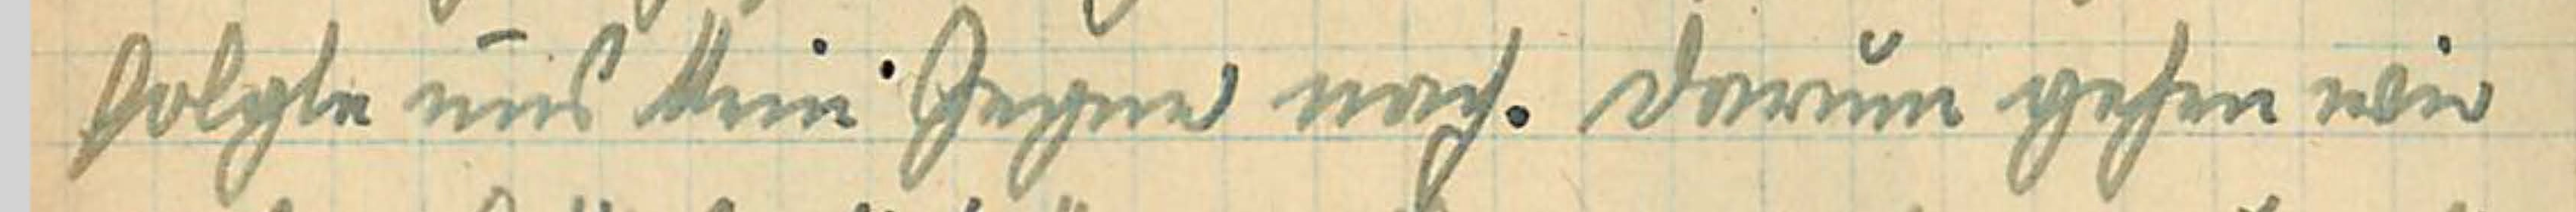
folgte uns kein Gegner nach. Darum gehen wir
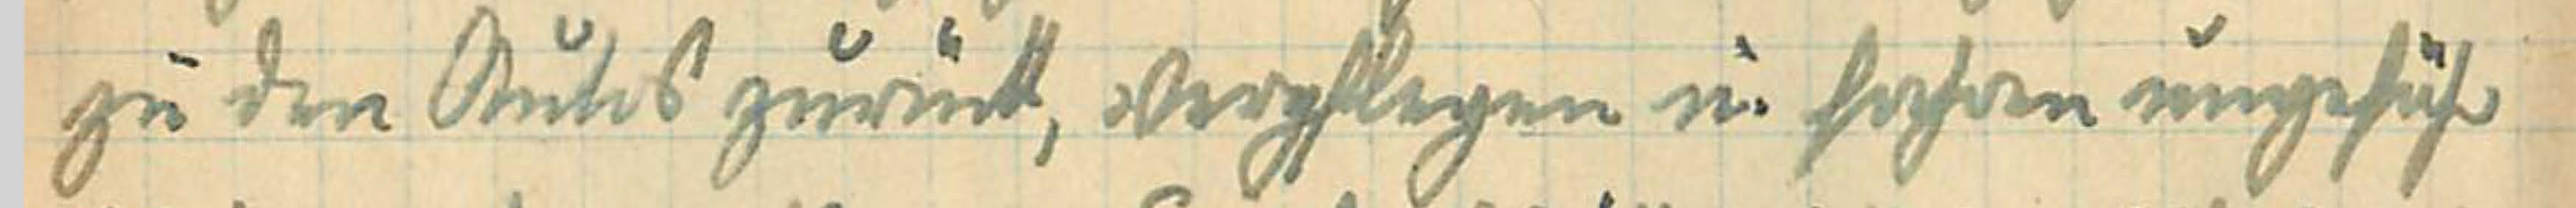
zu den Autos zurück, verpflegen u. fahren ungefähr
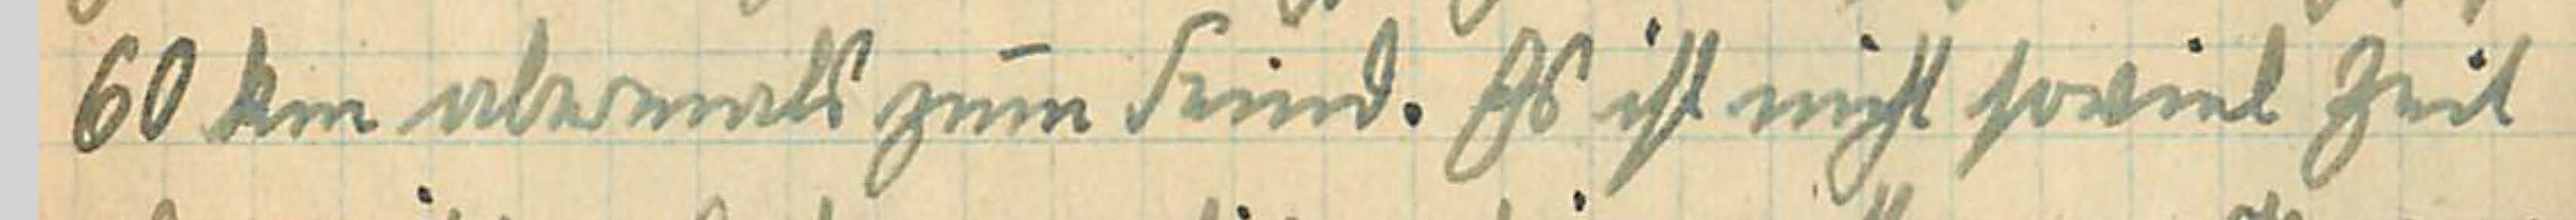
60 km abermals zum Feind. Es ist nicht soviel Zeit
